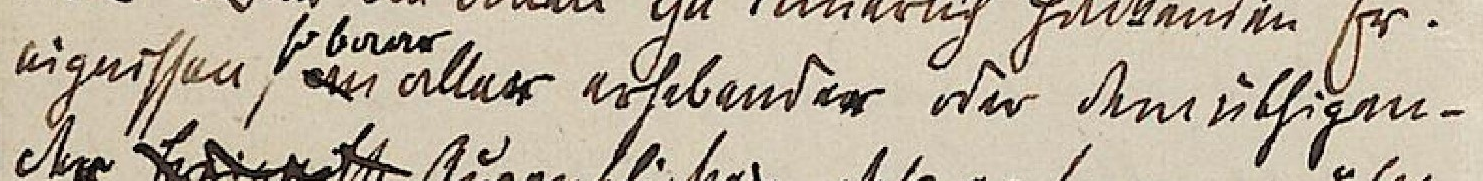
eignissen, an aller erhebender oder demüthigen¬
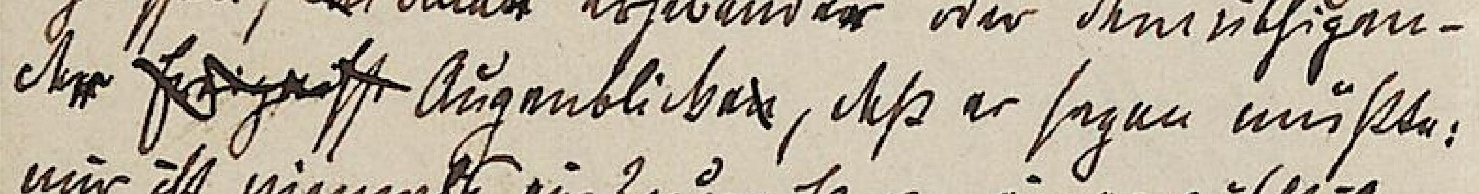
der Ereignisse Augenblicken, daß er sagen müßte:
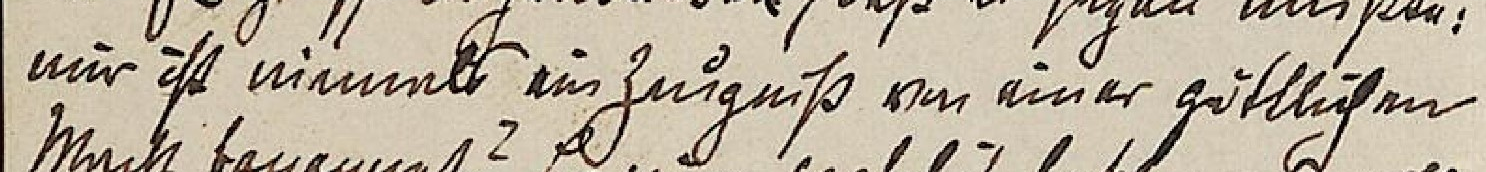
mir ist niemals ein Zeugeiß von einer göttlichen
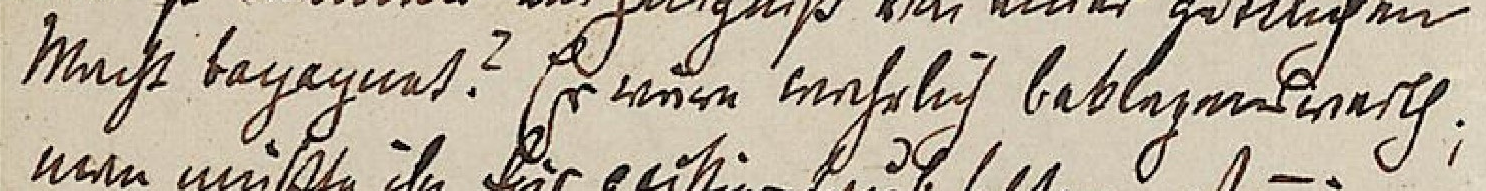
Macht begegnet? Er wäre wahrlich beklagenswerth;
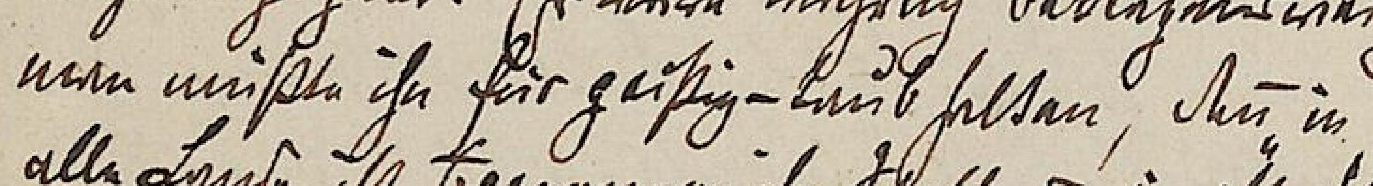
man müßte ihn für geistig_taub halten, den "in
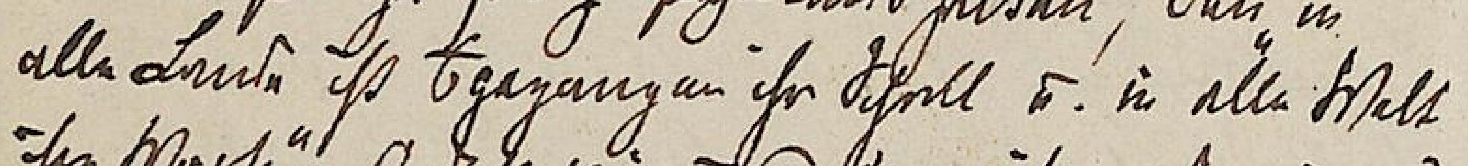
alle Lande ist sgegangen ihr Schall u. in alle Welt
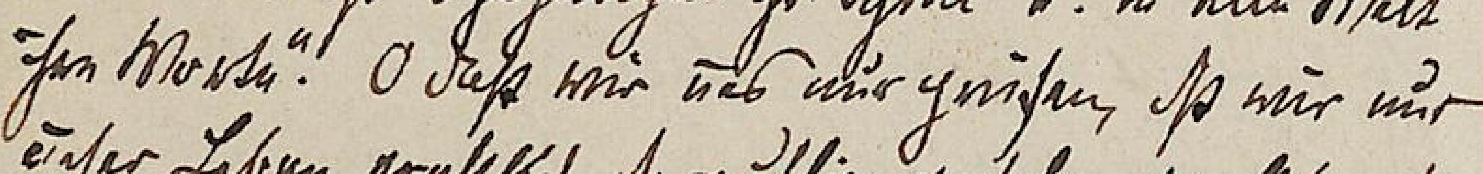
ihre Worte!" O daß wir uns nur preisen, daß wir nur
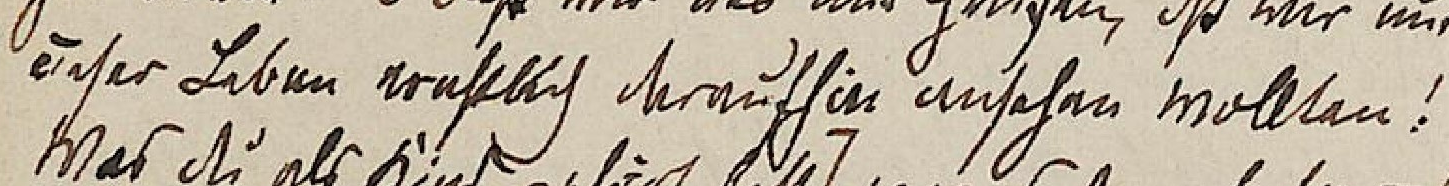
unser Leben ernstlich daraufhin ansehen wollten!
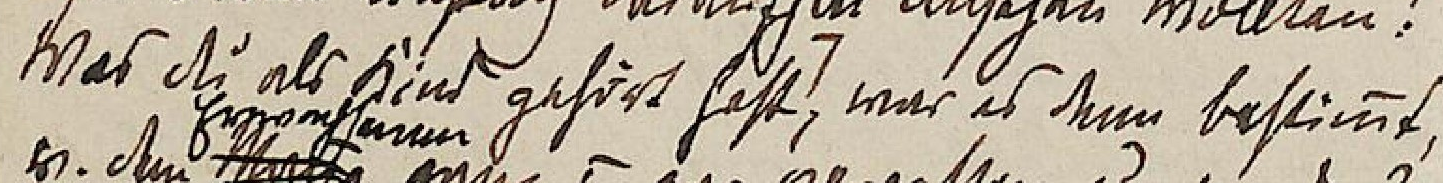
Was du als Kind gehört hast, war es denn bestimmt,
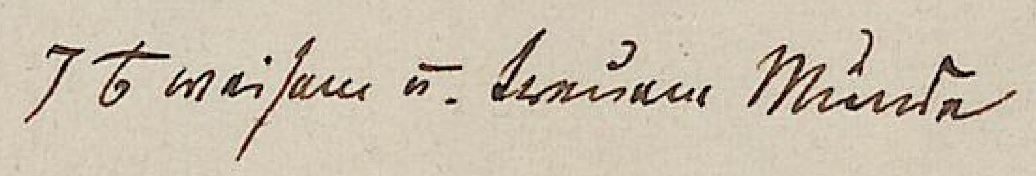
] s weisen weisem u. treuen Munde
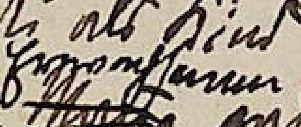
Erwachsenen
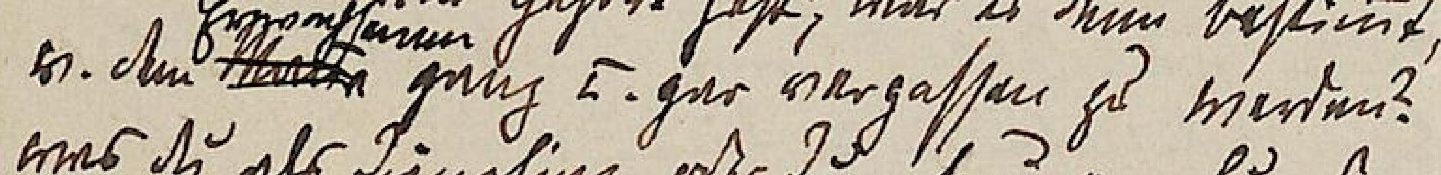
v. dem Malte ganz u. gar vergessen zu werden?
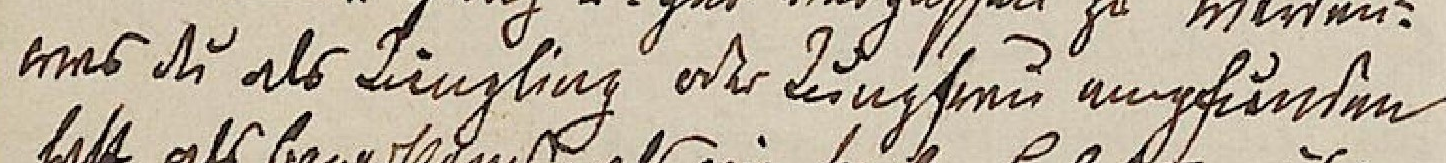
was die als Jüngling oder Jungfrau empfunden
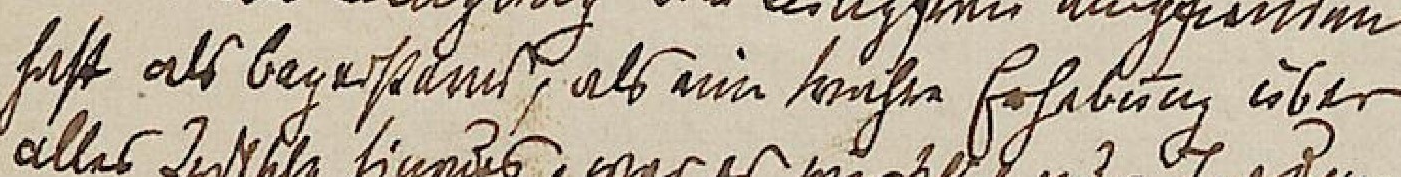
hat als begeisternd, als eine frühe Erhebung über
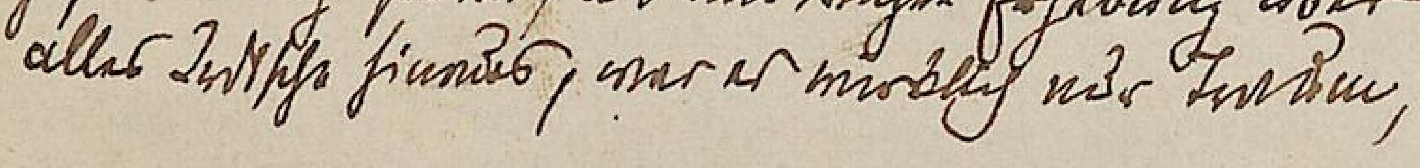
alles Irdische hinaus, war es wirklich Traum,
